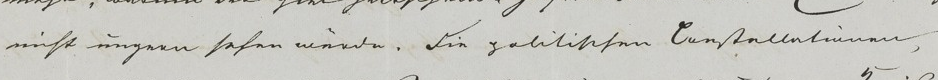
nicht ungern sehen würde. Die politischen Constellationen,
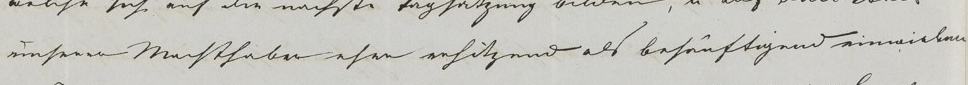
unserer Machthaber eher erhitzend als besänftigend einwirken
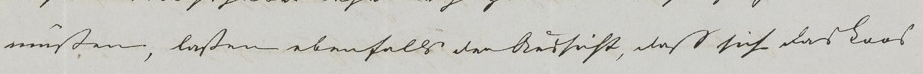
müßen, laßen ebenfalls der Aussicht, daß sich das Loos
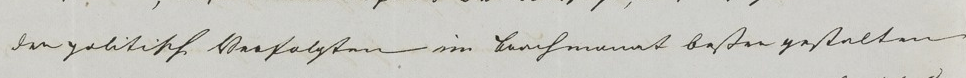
der politisch Verfolgten im Brachmonat beßer gestalten
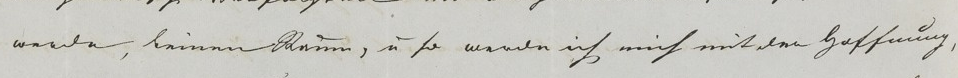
werde, keinen Raum, u so werde ich mich mit der Hoffnung,
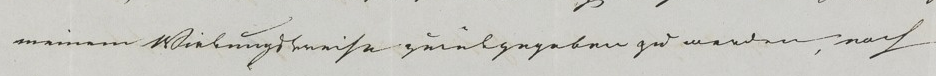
meinem Wirkungskreise zurükgegeben zu werden, noch
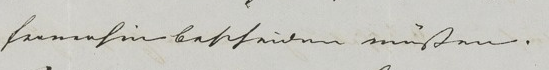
fernerhin bescheiden müßen.
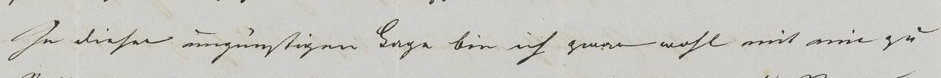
In dieser ungünstigen Lage bin ich zwar wohl mit mir zu
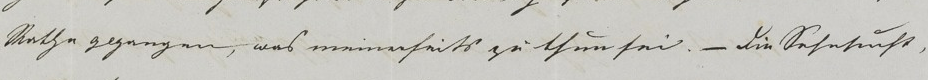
Rathe gegangen, was meinerseits zu thun sei. – Die Sehnsucht,
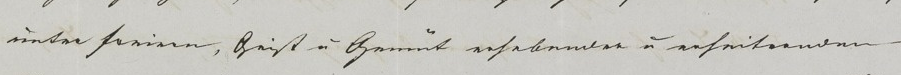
unter freiern, Geist u Gemüt erhebenden u erheiternden
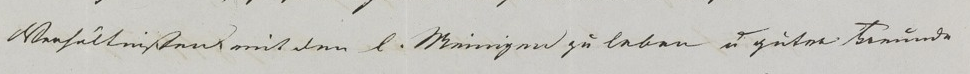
Verhältnißen mit den l. Meinigen zu leben u guter Freunde
